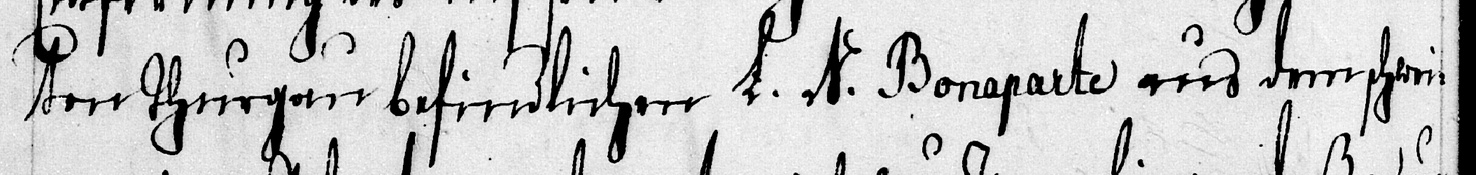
ton Thurgau befindlichen L. N. Bonaparte aus dem schwei¬
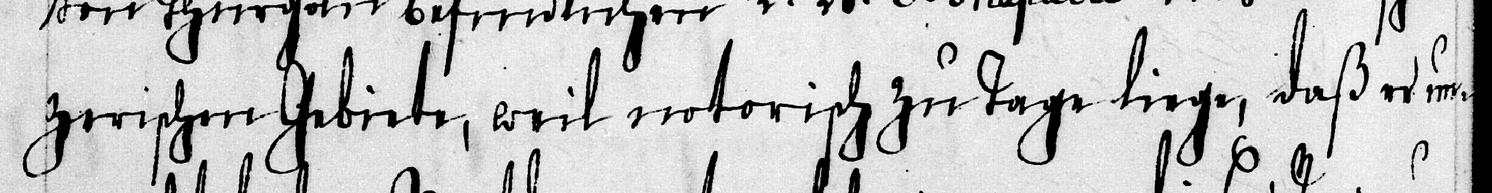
zerischen Gebiete, weil notorisch zu Tage liege, daß er un¬
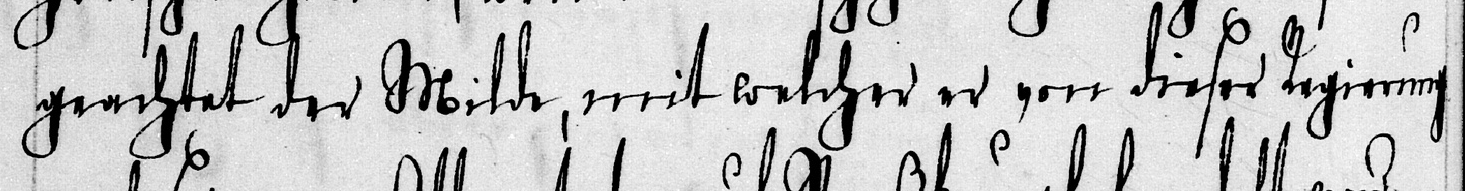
geachtet der Milde, mit welcher er von dieser Regierung
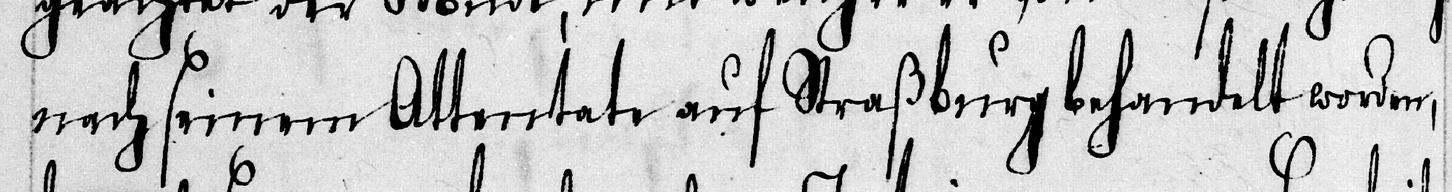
nach seinem Attentate auf Straßburg behandelt worden,
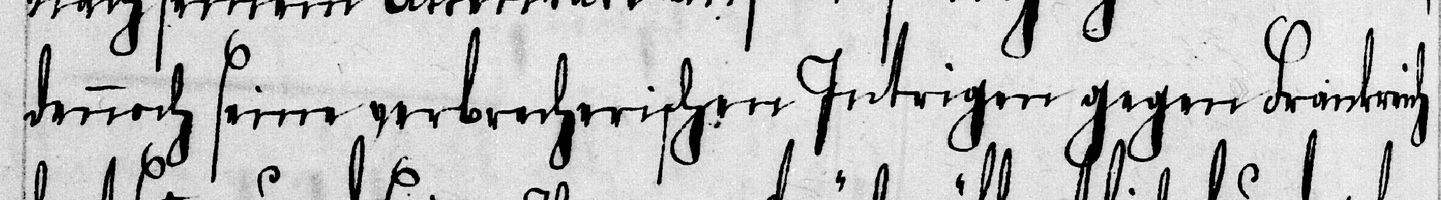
dennoch seine verbrecherischen Intrigen gegen Frankre¬
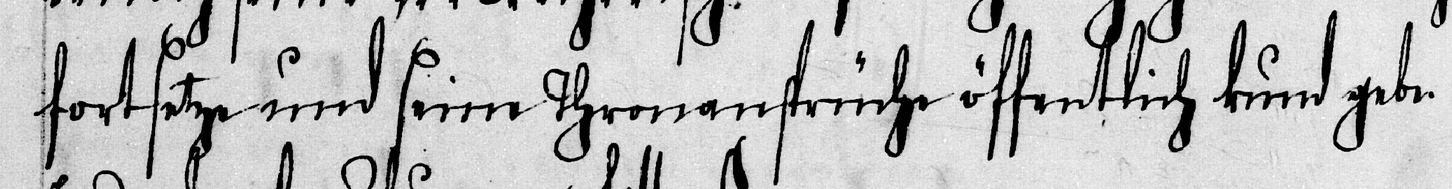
fortsetze und seine Thronansprüche öffentlich kund gebe.
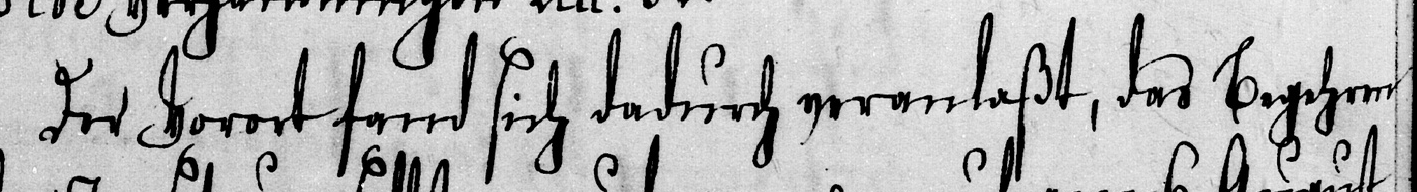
Der Vorort fand sich dadurch veranlaßt, das Begehren
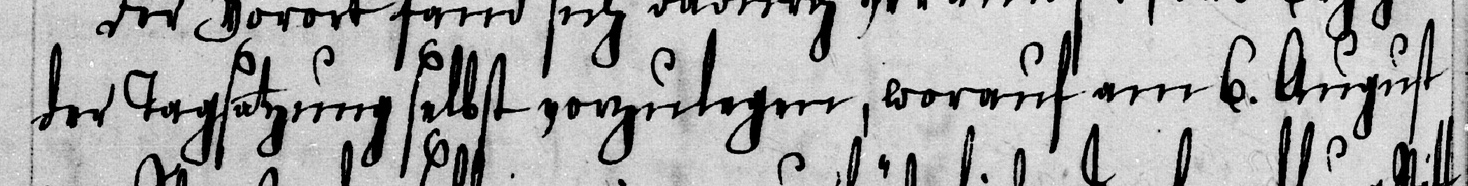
der Tagsatzung selbst vorzulegen, worauf am 6. August
